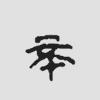不
